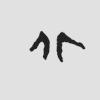北
